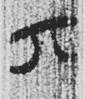亓（其）
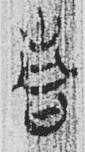青（情）
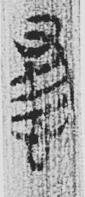○（盡）
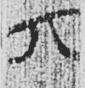亓（其）
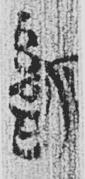○（慎）
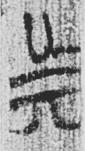者
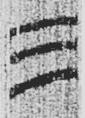三
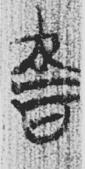害
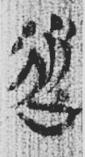近
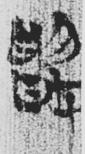與
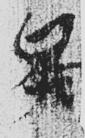矣
